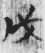戊
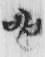申
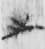之
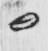日
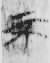不
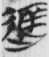𬨭（將）
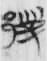○（菐）
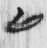㠯（以）
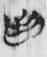○（廷）
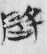阩
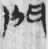門
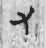又
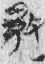敗
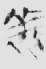羕
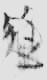○（路）
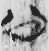公
